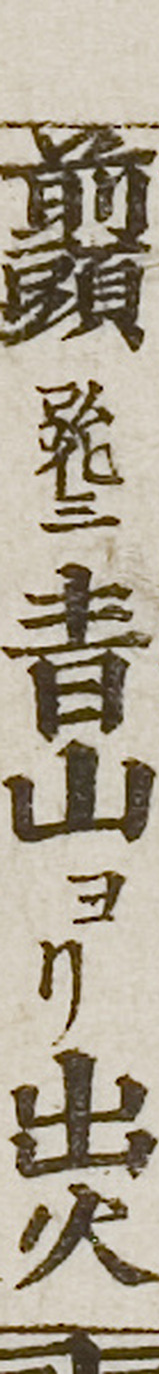前頭弘化三青山ヨリ出火
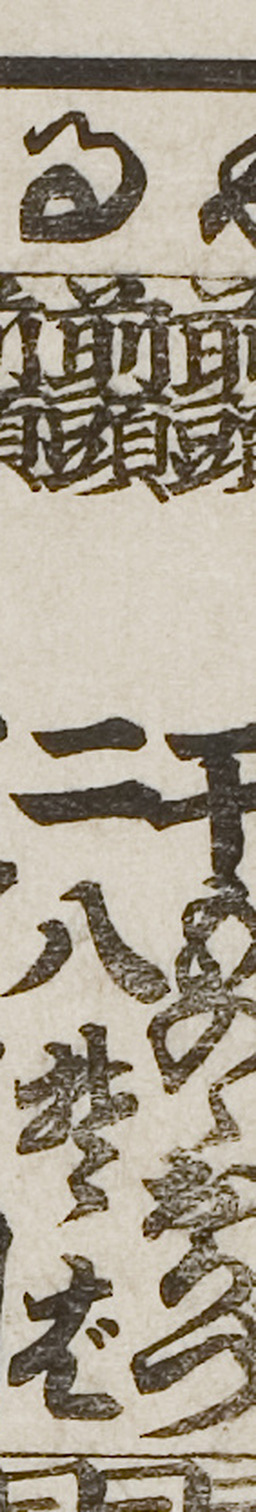前頭二八そば
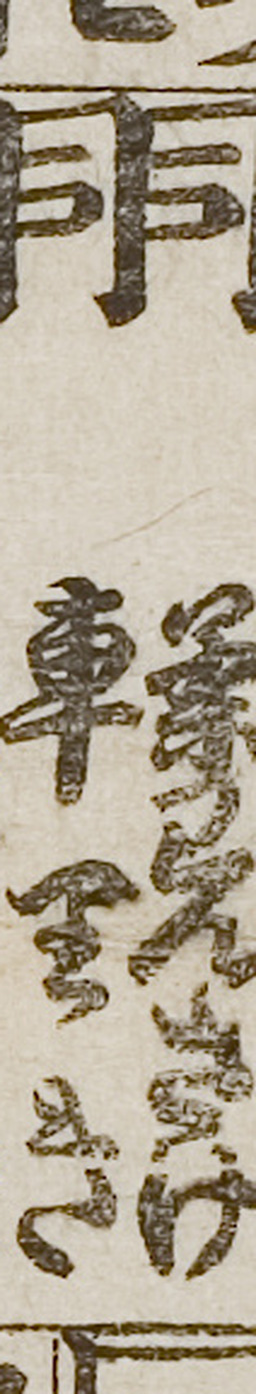同車りき
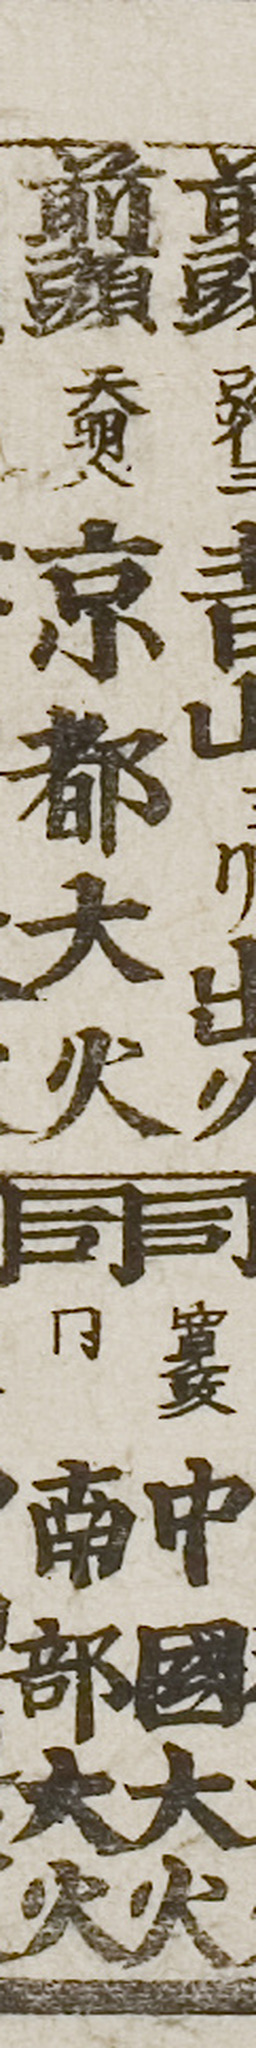前頭天明八京都大火
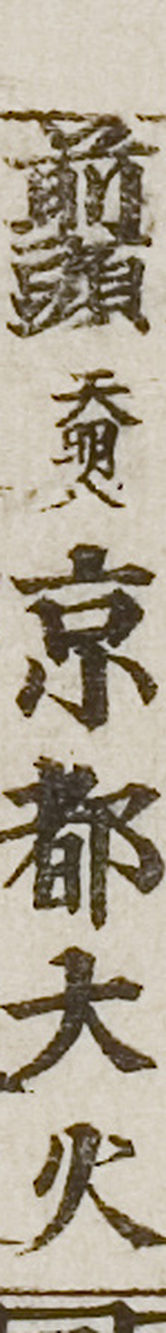前頭天明八京都大火
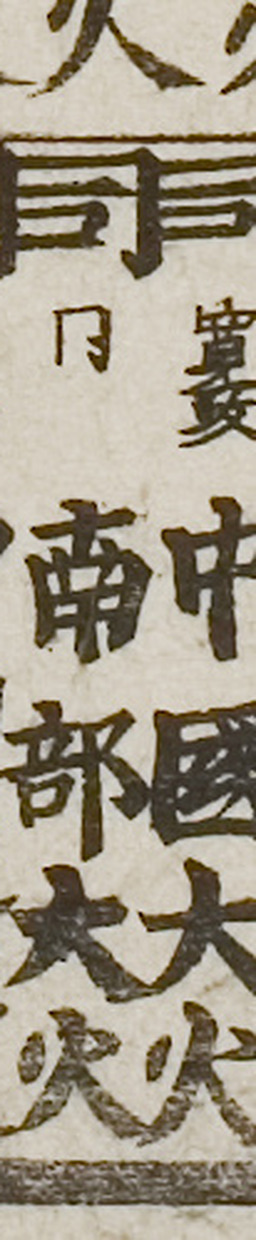同同南部大火
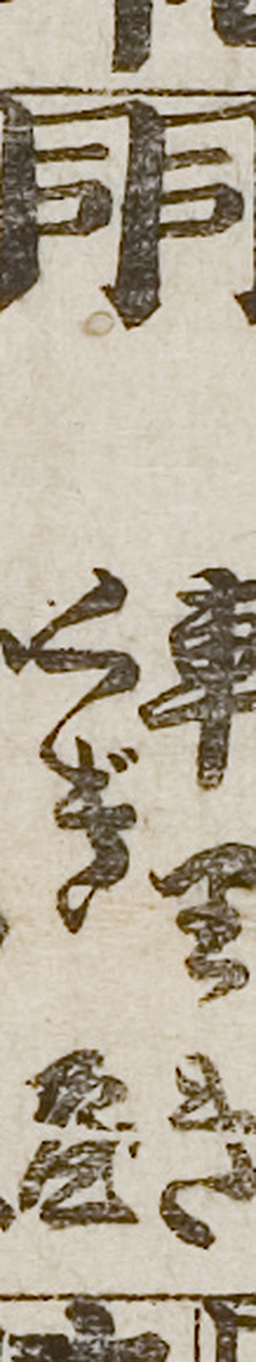同くぎ屋
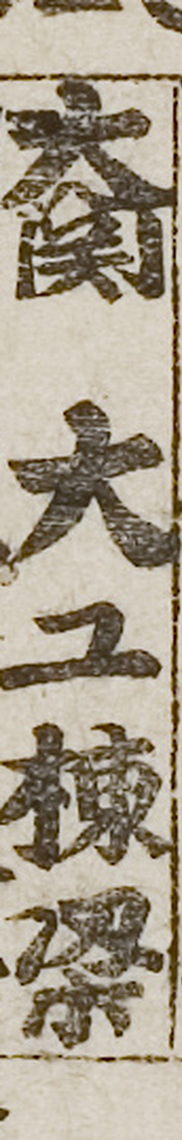大関大工棟梁
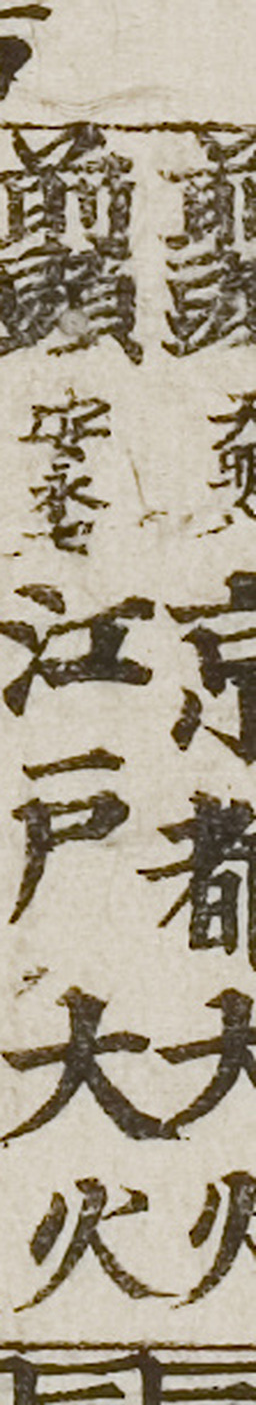前頭安永七江戸大火
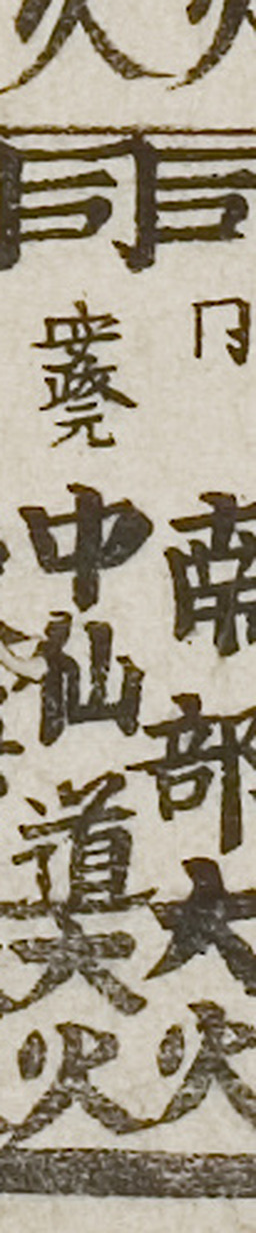同安政元中仙道大火
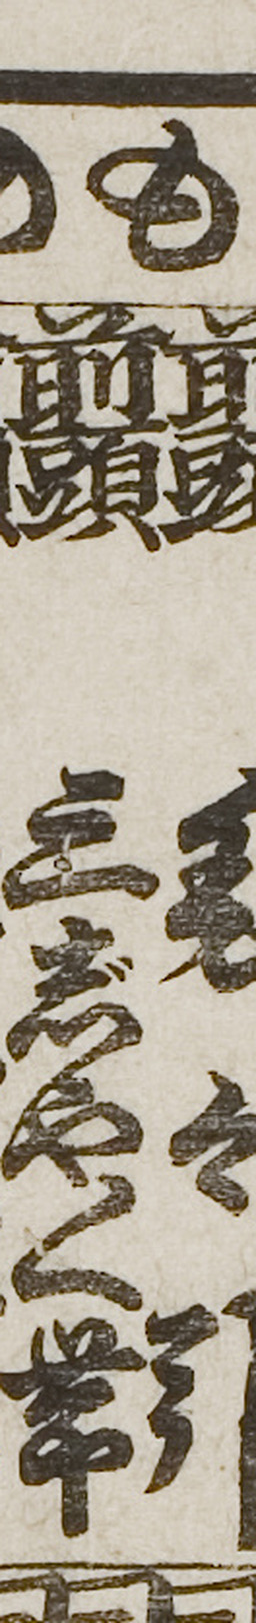前頭三じやく帯
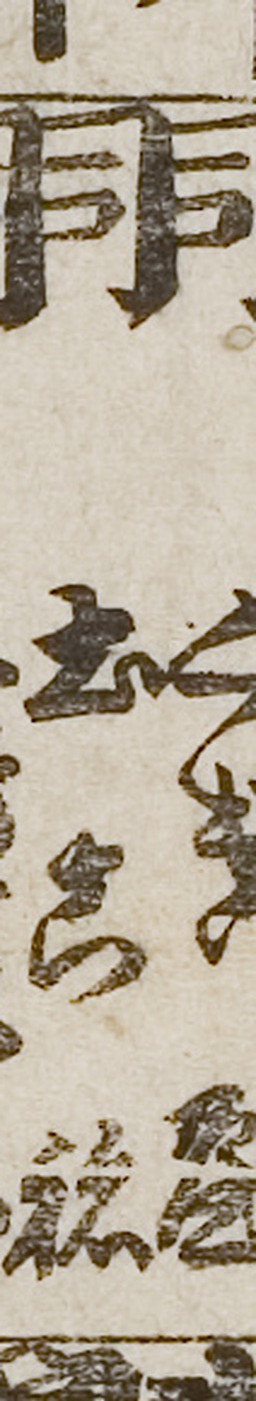同土こね
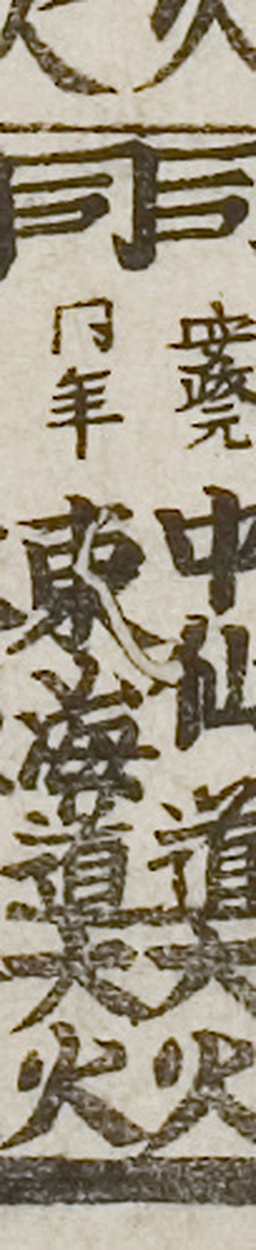同同年東海道大火
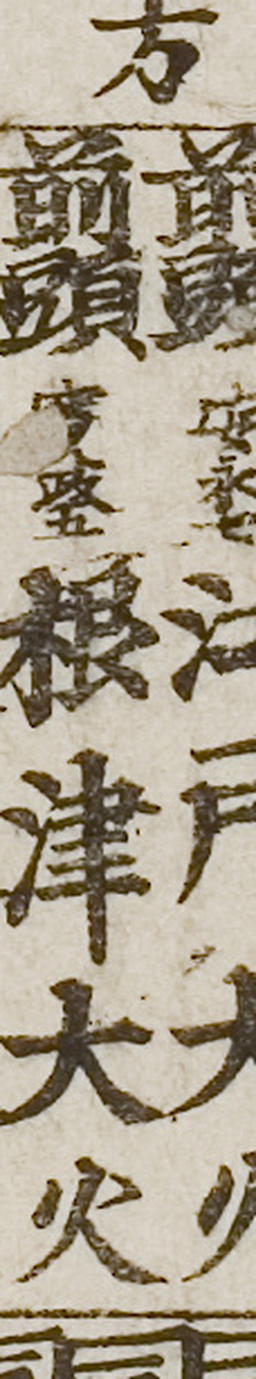前頭寛政五根津大火
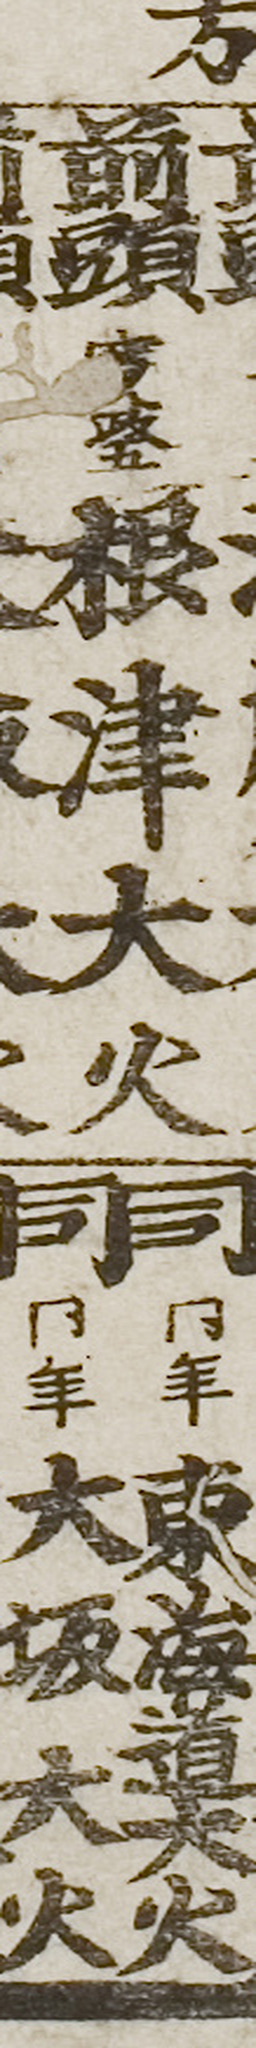前頭寛政五根津大火
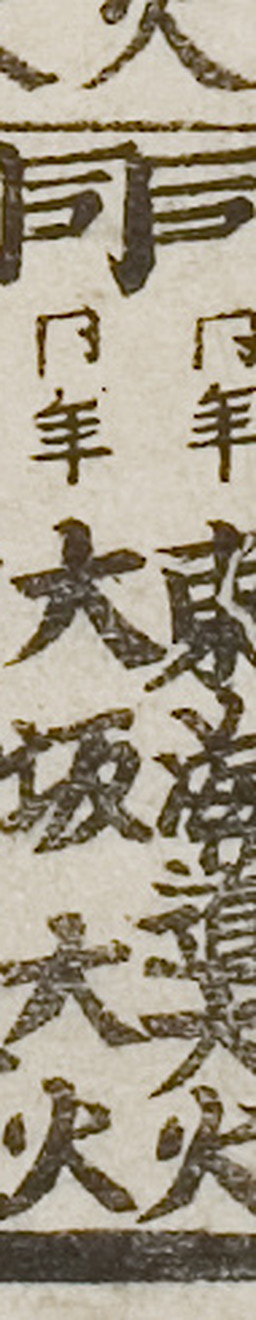同同年大坂大火
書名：世中当座帳
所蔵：東京大学総合図書館 General Library in the University of Tokyo, JAPAN
